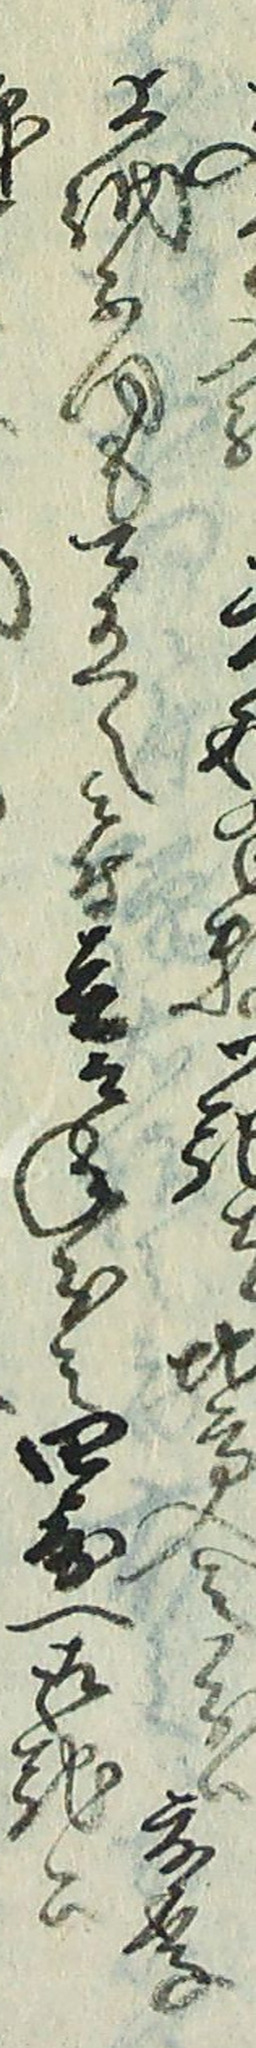上納不同も可有之ニ付壱ケ年分之四歩一御馳被
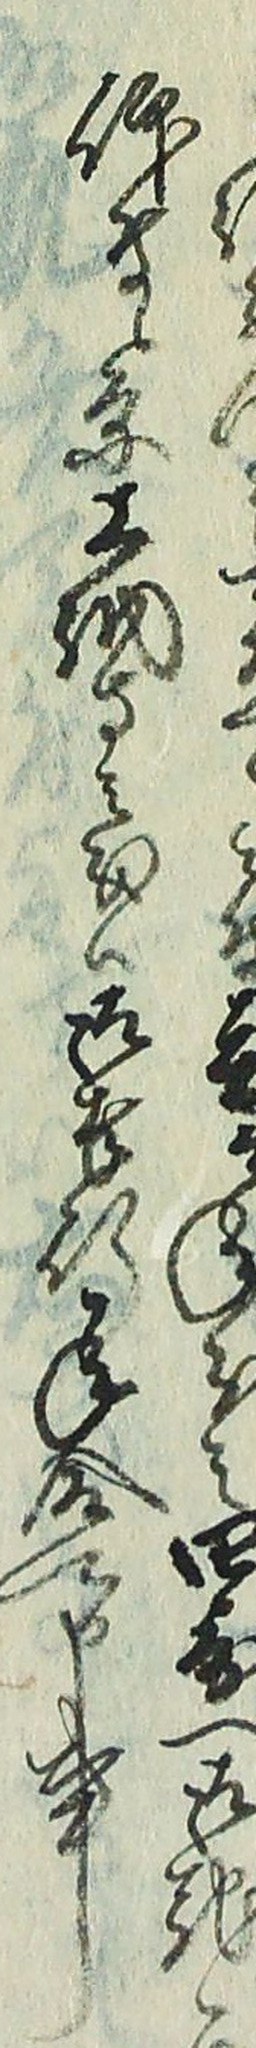仰付候条上納方之義ハ御奉行承合可申事
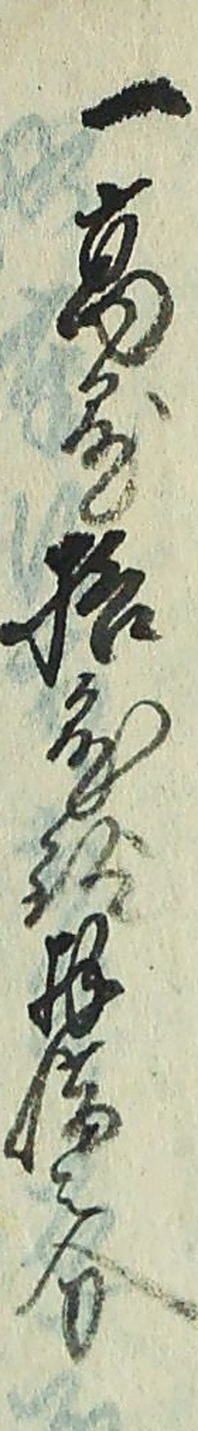一高懸格懸銀拝借之分
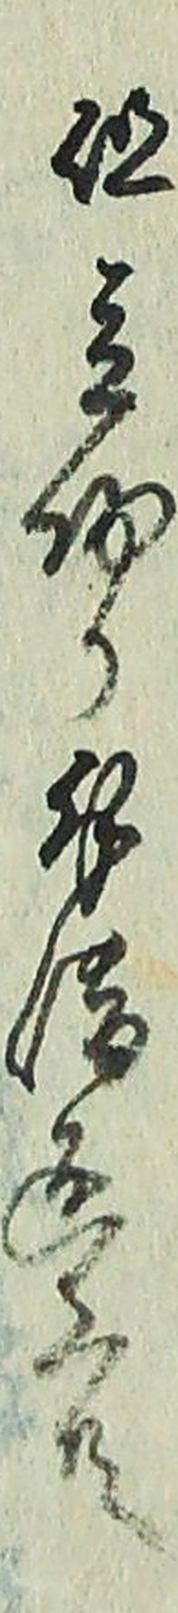但立帰拝借返上共
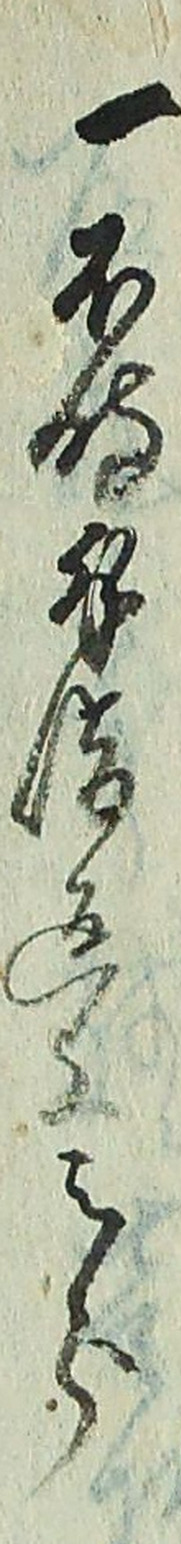一不時拝借返上之分
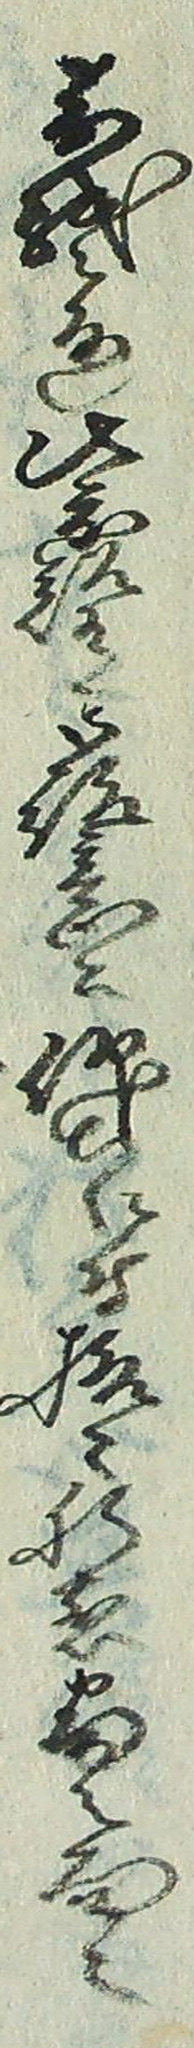別紙之通此度難有御趣意被仰出候ニ付格々肝煎番之面々
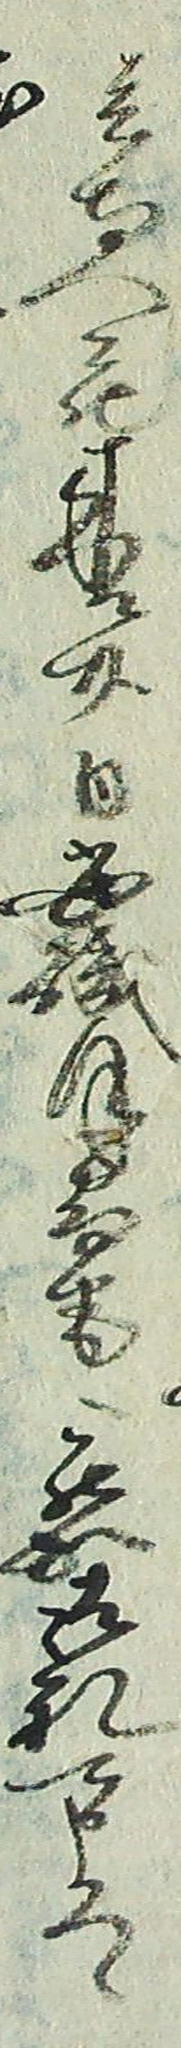壱両人宛来ル廿日當職月番宅へ罷出御礼可申上候
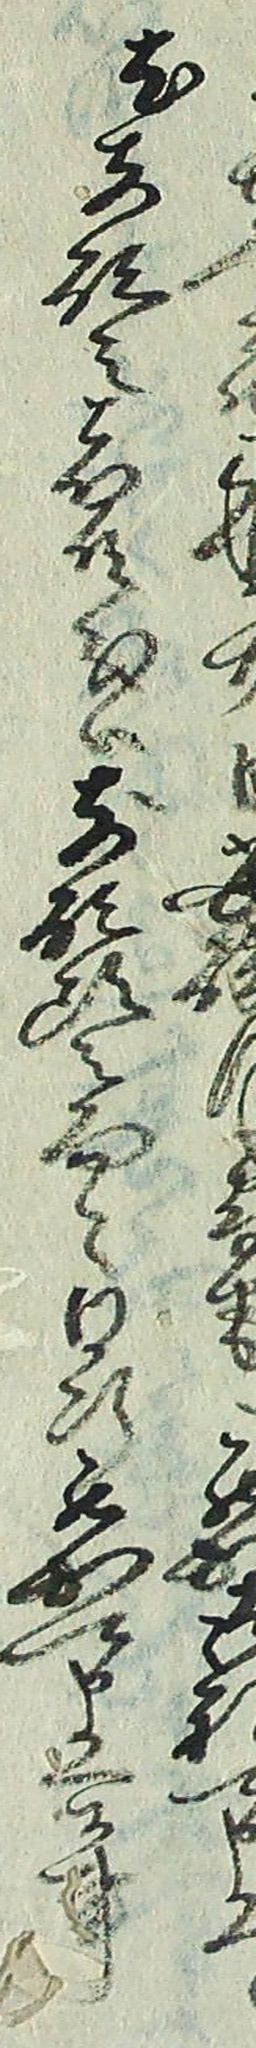尤支配之者共義ハ支配頭之面々同断罷出可申上候事
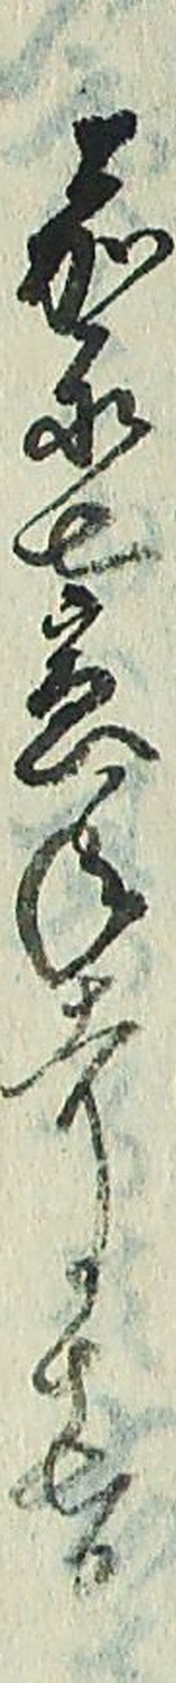嘉永七寅年十一月十七日
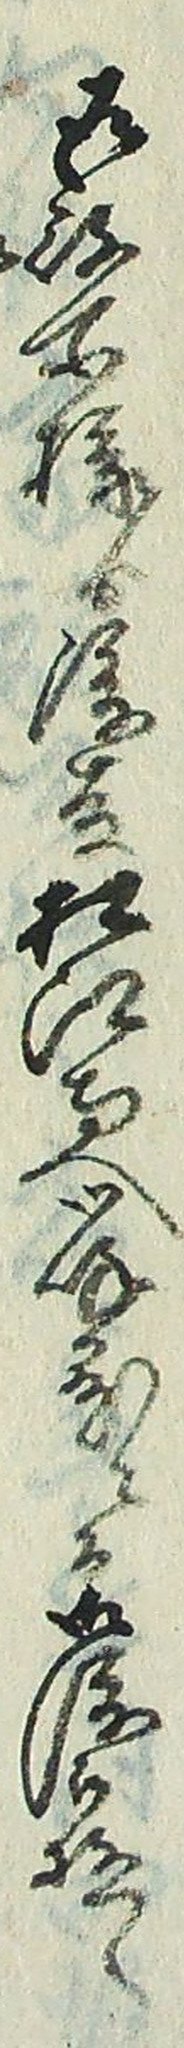御役所様ゟ後藤松江両人御呼懸ニ而御渡被遊候
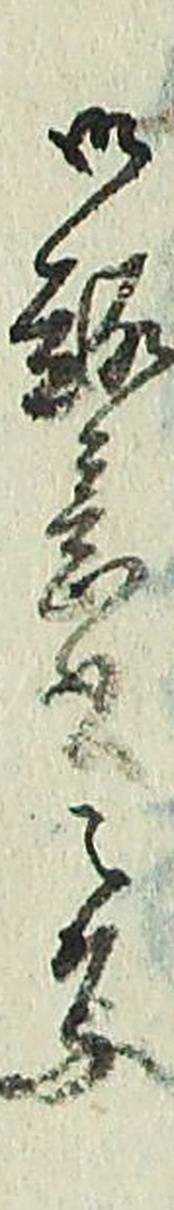御趣意書之写

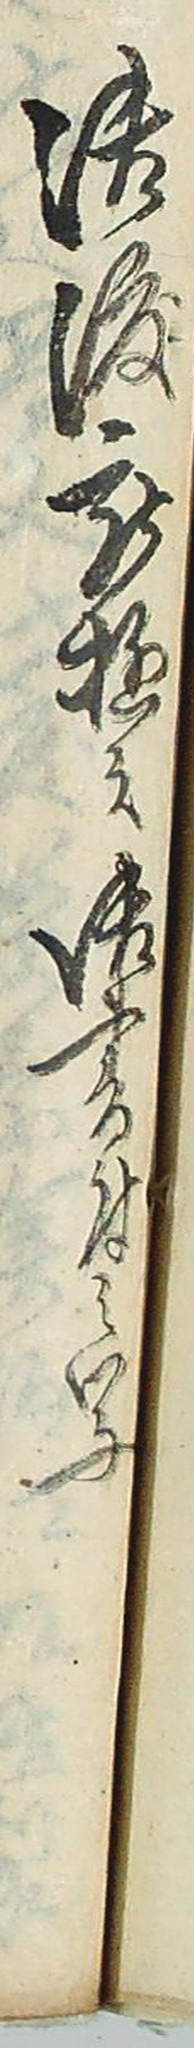御渡被遊候御書付之写
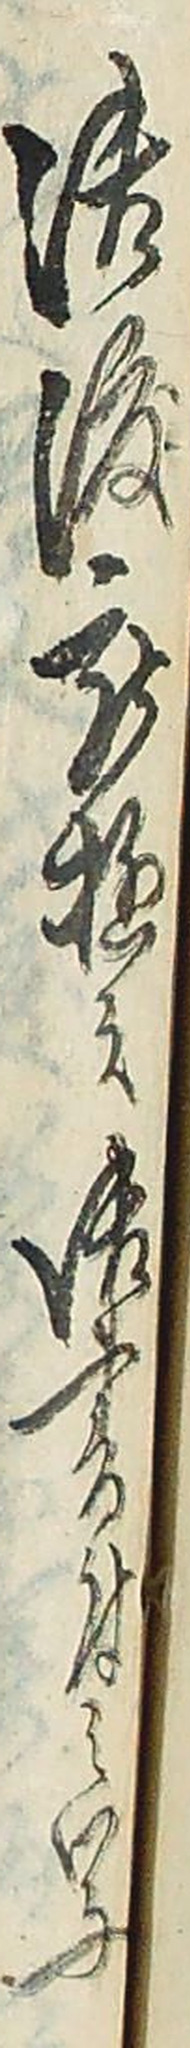御渡被遊候御書付之写
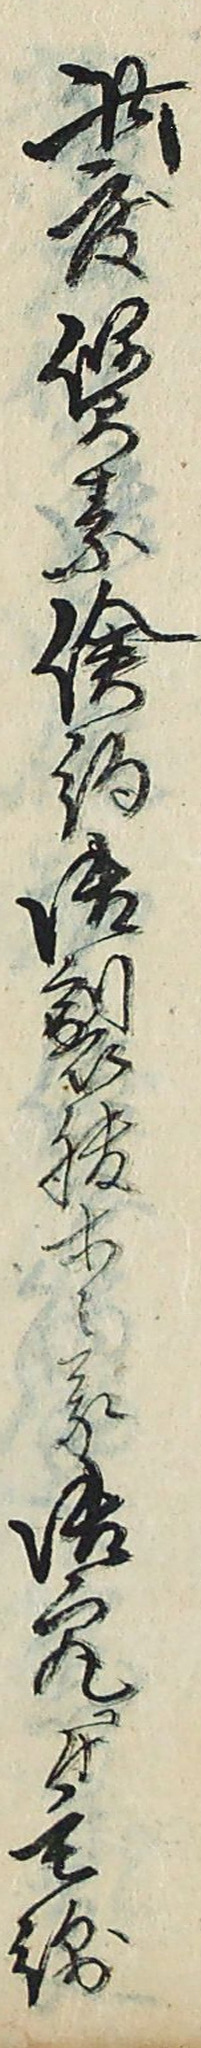此度質素倹約御製服等之義御究ニ付毛綿
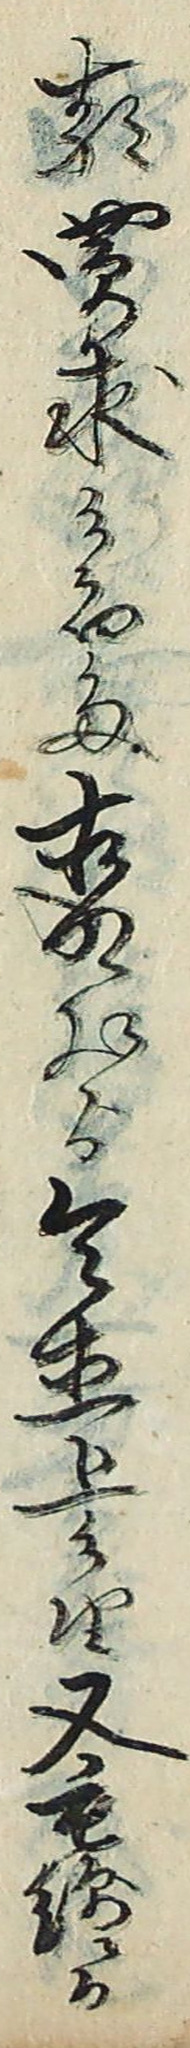類買求候者多相成候処ゟ令直上候由又毛綿ニ而
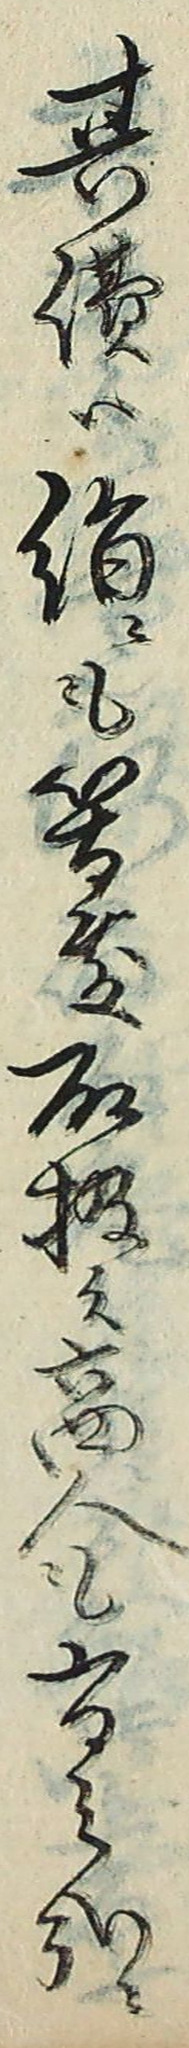其價ハ絹ニも等敷取扱候商人も有之哉ニ
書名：諸御趣意書并御下知向之写
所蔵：鳴門教育大学 Naruto University of Education
